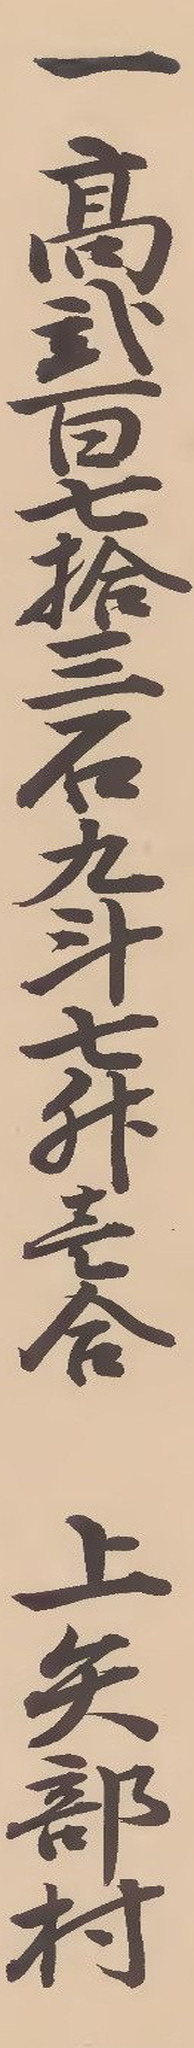一高弐百七拾三石九斗七升壱合上矢部村
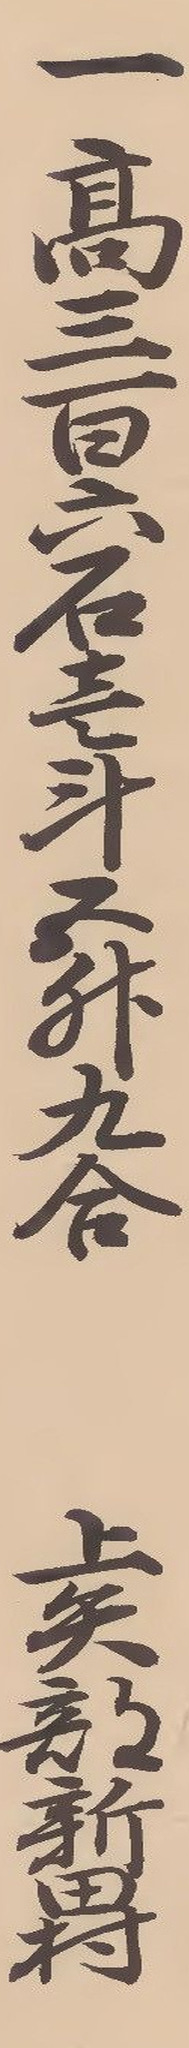一高三百六石壱斗五升九合上矢部新田村
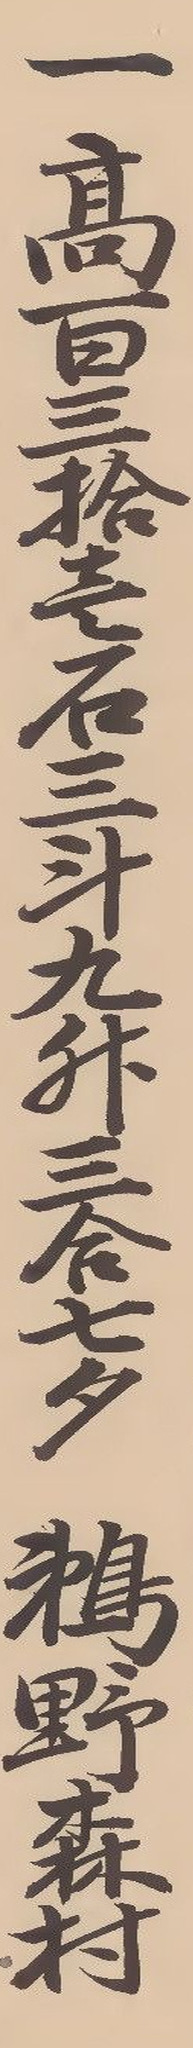一高百三拾壱石三斗九升三合七勺鵜野森村
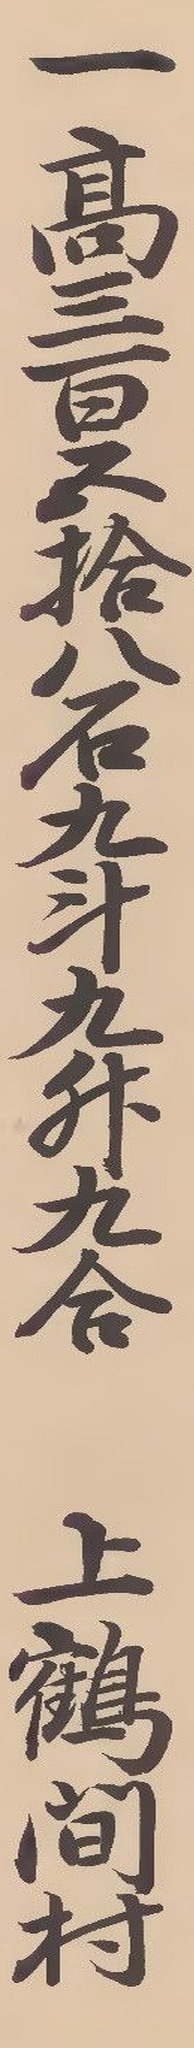一高三百五拾八石九斗九升九合上鶴間村
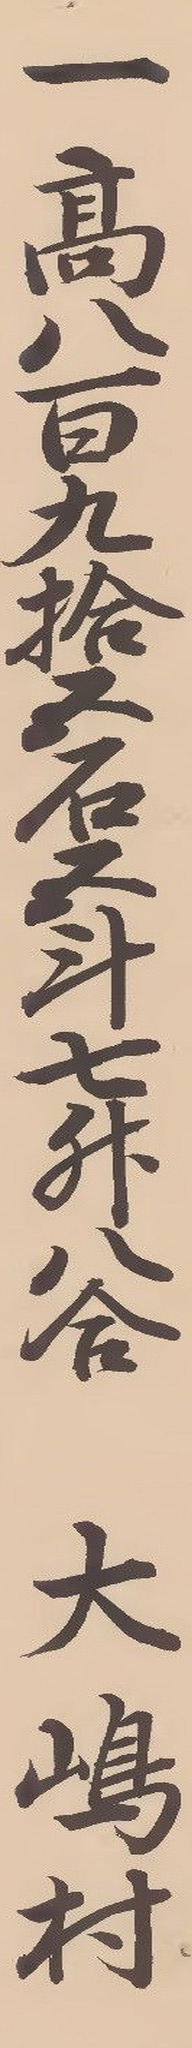一高八百九拾五石五斗七升八合大嶋村
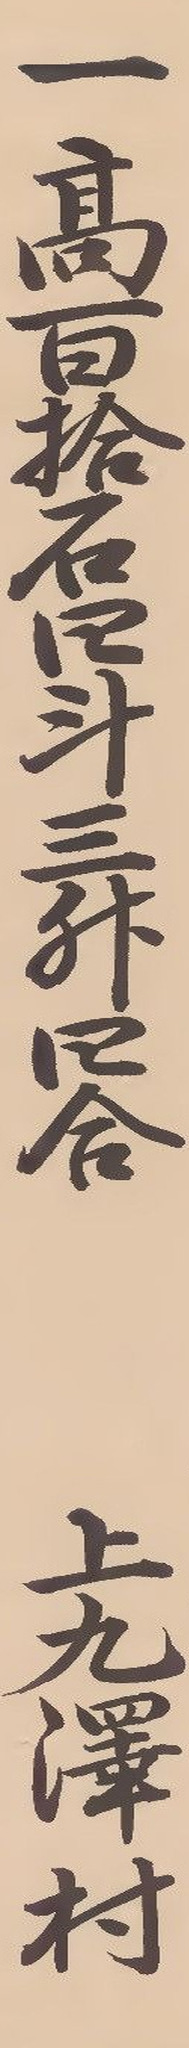一高百拾石四斗三升四合上九澤村
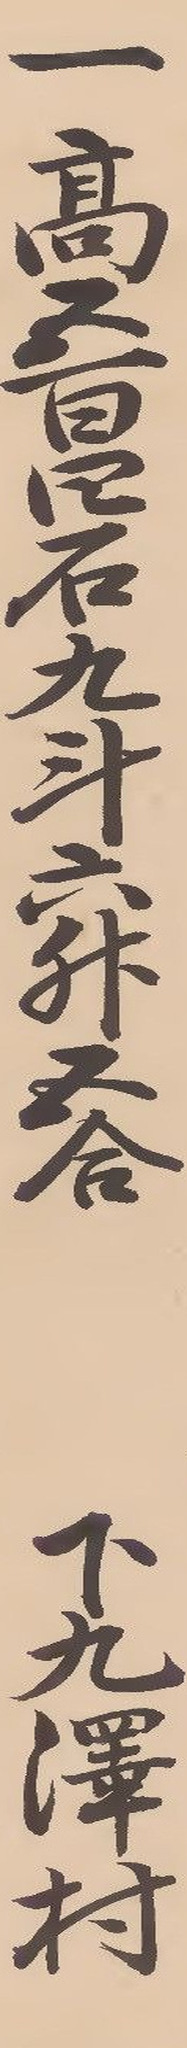一高五百四石九斗六升五合下九澤村

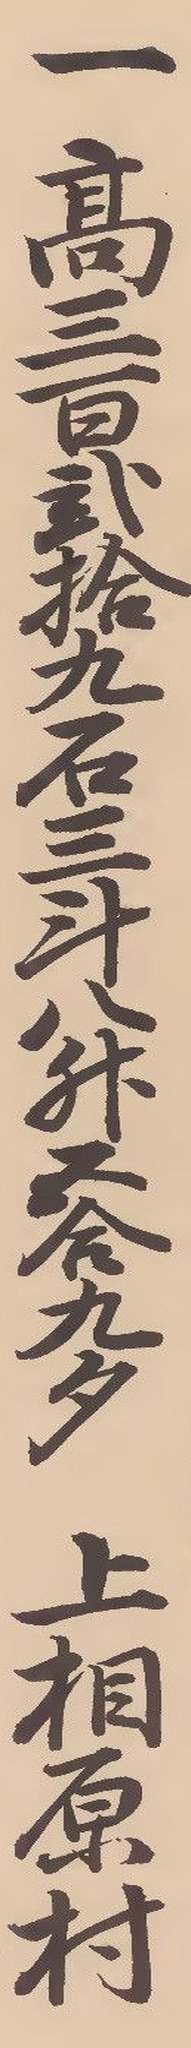一高三百弐拾九石三斗八升五合九勺上相原村
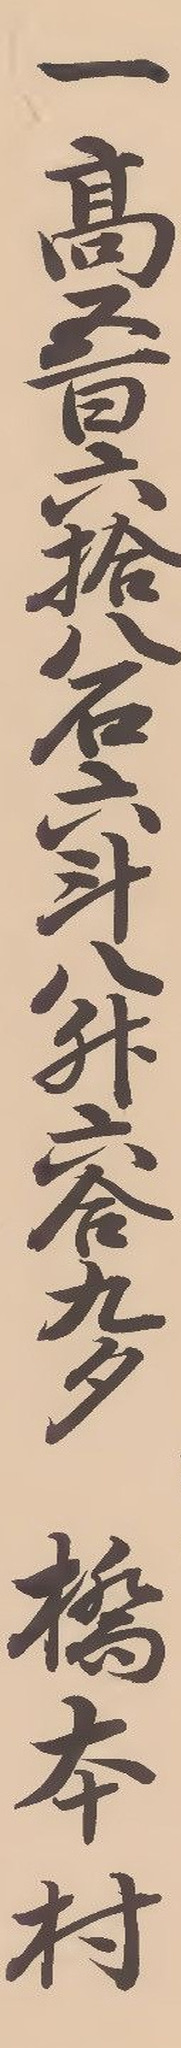一高五百六拾八石六斗八升六合九勺橋本村
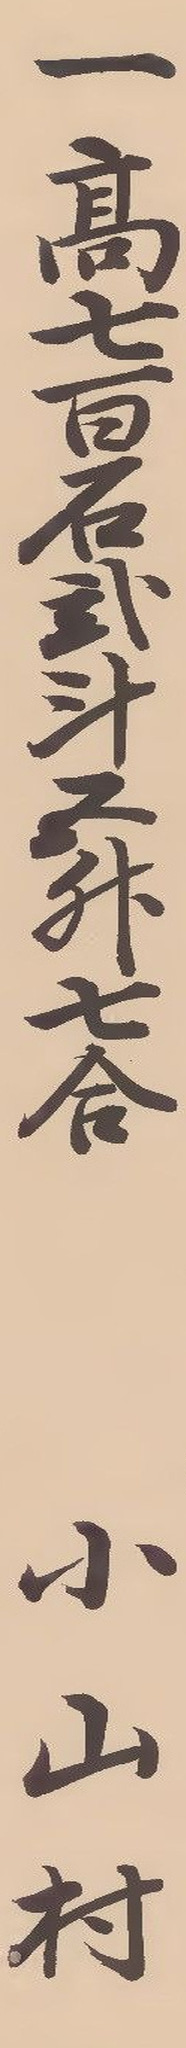一高七百石弐斗五升七合小山村
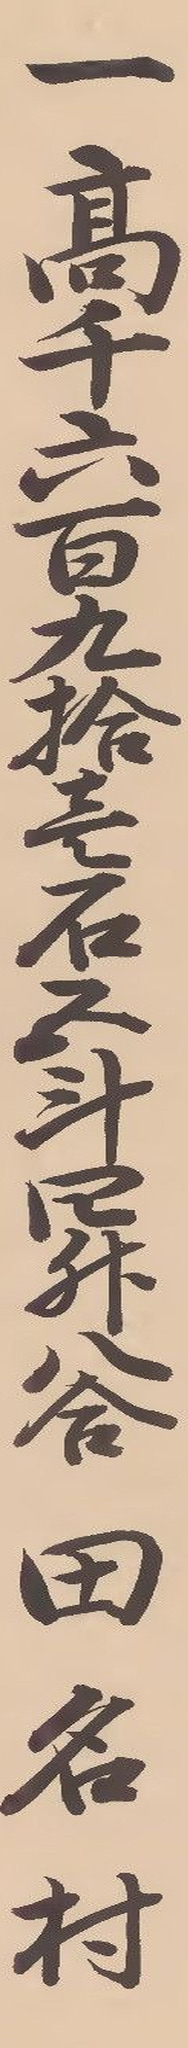一高千六百九拾壱石五斗四升八合田名村
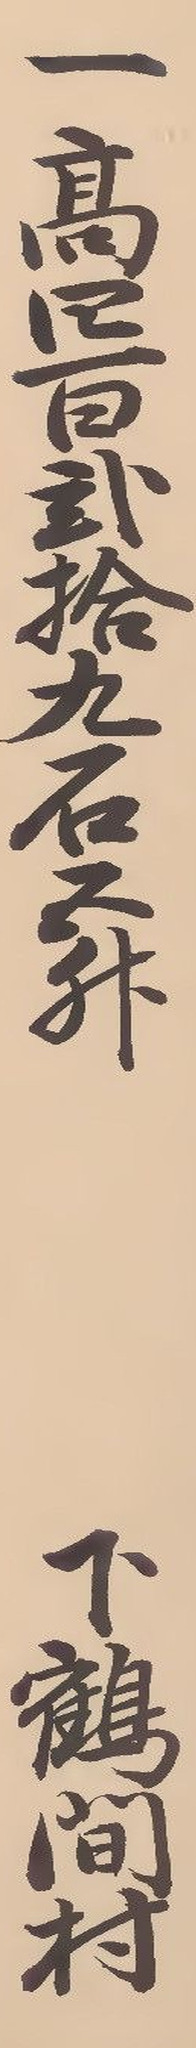一高四百弐拾九石五升下鶴間村
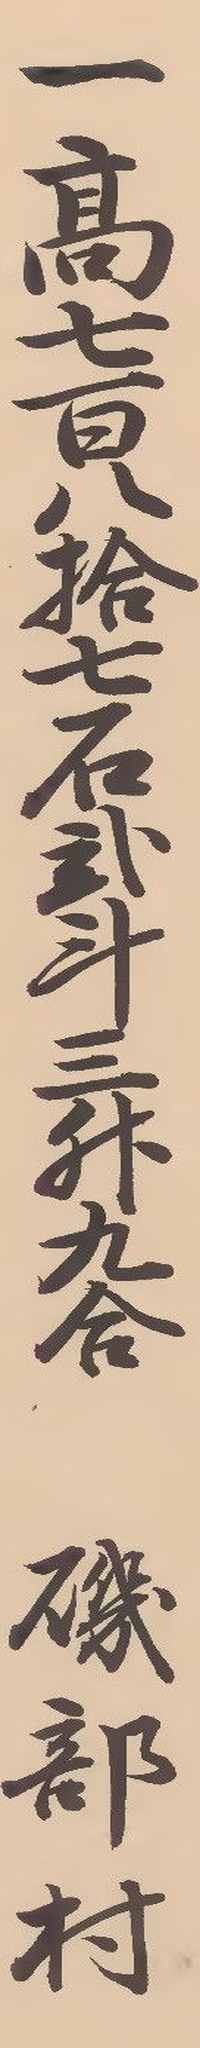一高七百八拾七石弐斗三升九合磯部村
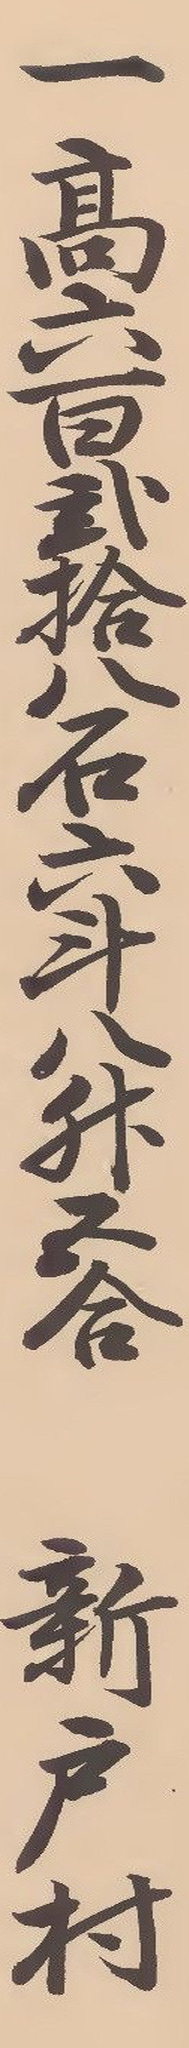一高六百弐拾八石六斗八升五合新戸村
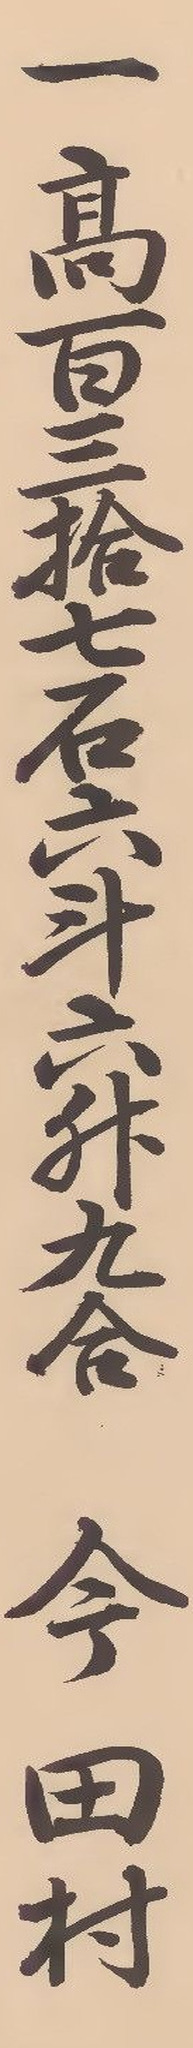一高百三拾七石六斗六升九合今田村

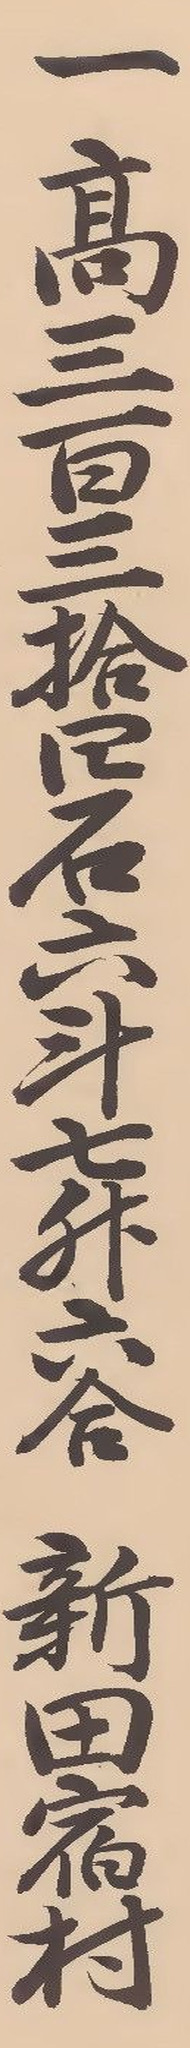一高三百三拾四石六斗七升六合新田宿村
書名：相模国郷帳
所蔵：国立公文書館 National Archives of Japan
